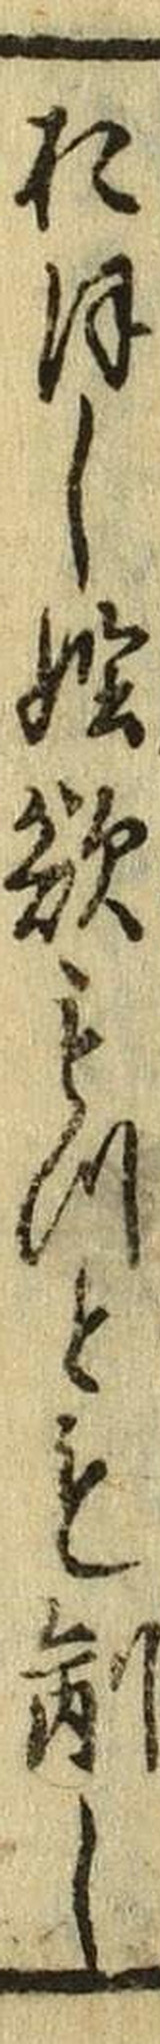おほし婬欲もつとも制し
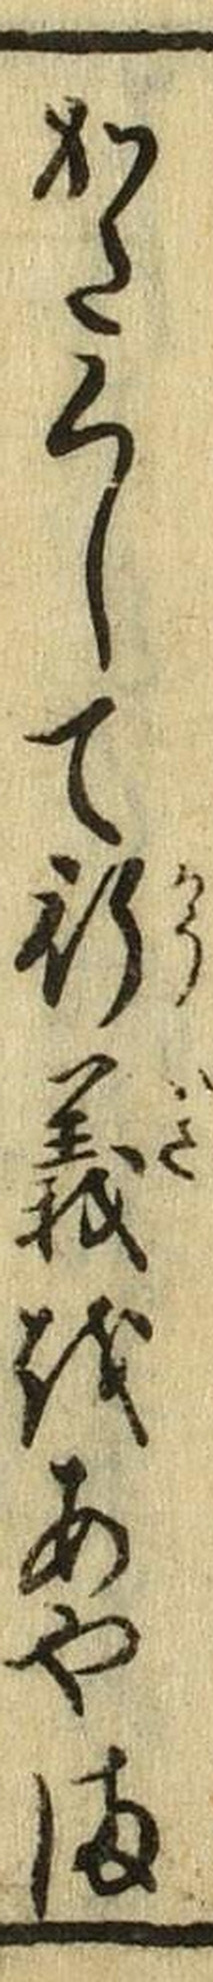かたくして行義をあやま
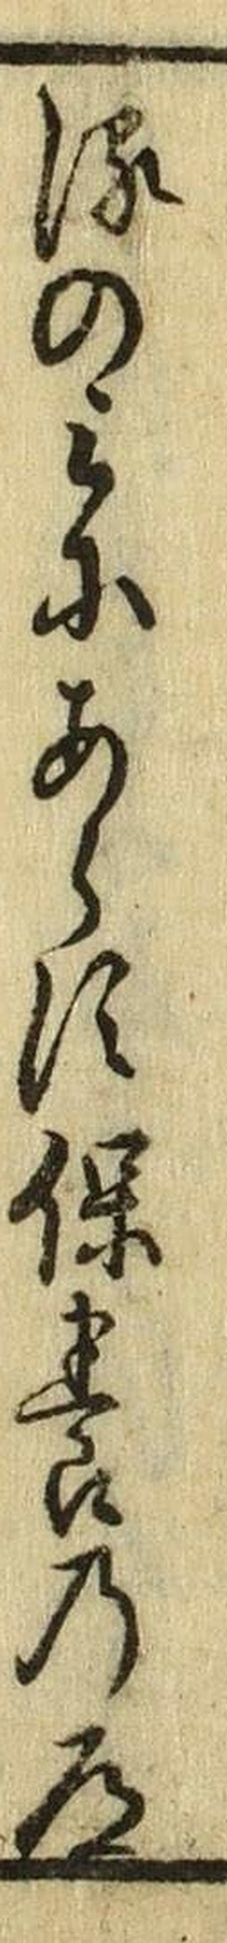るのみにあらす保養の道
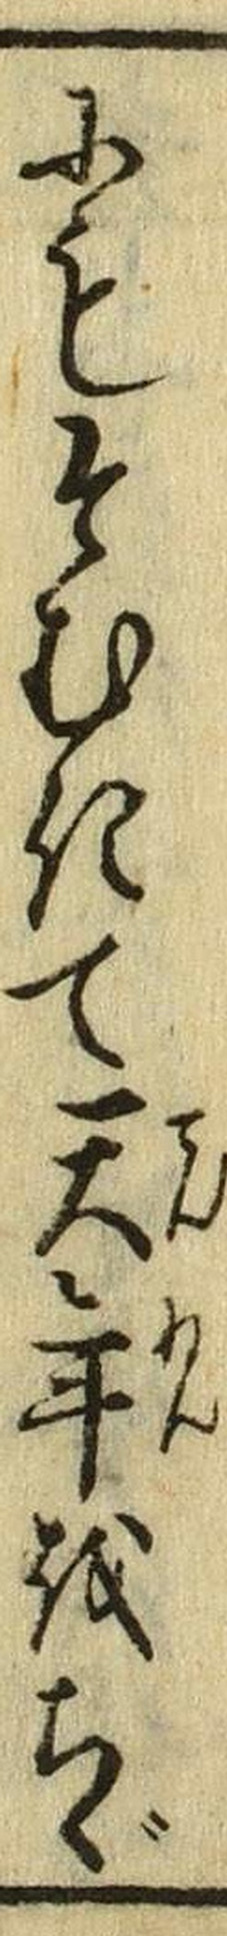にもそむきて天年をちゞ
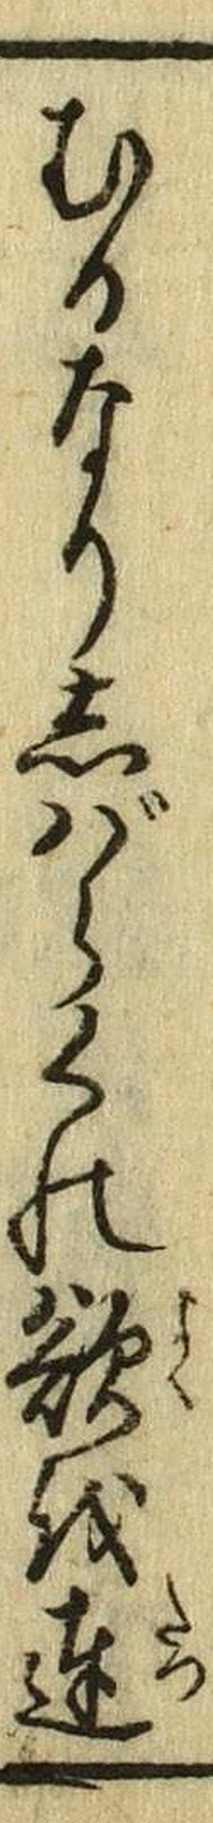むるなりしばらくの欲を達
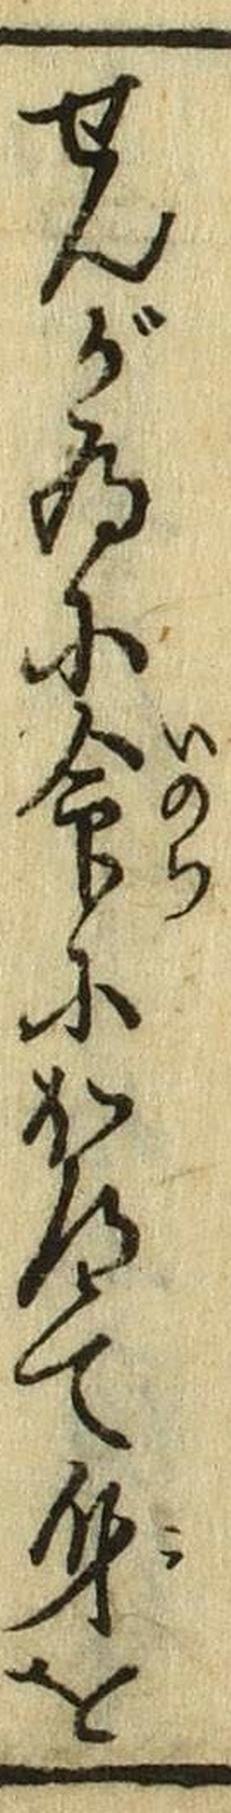せんが為に命にかへて身を
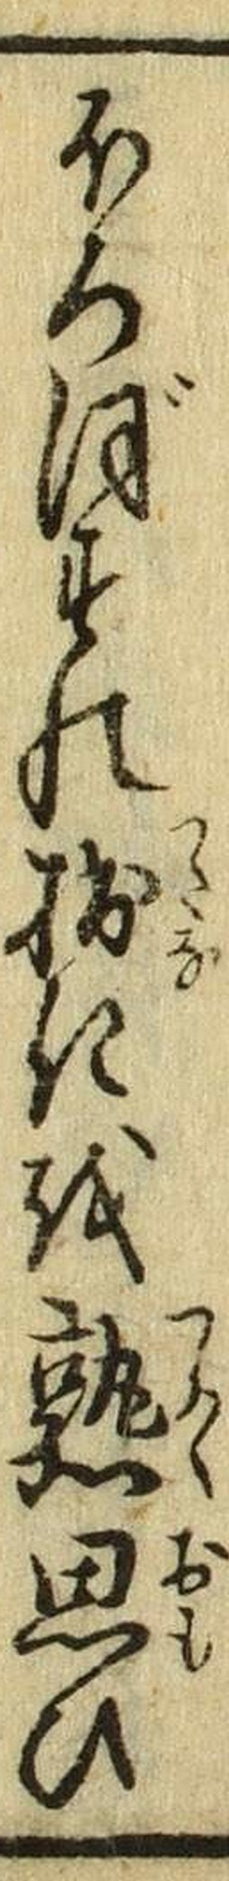ほろぼすの拙きを熟思ひ
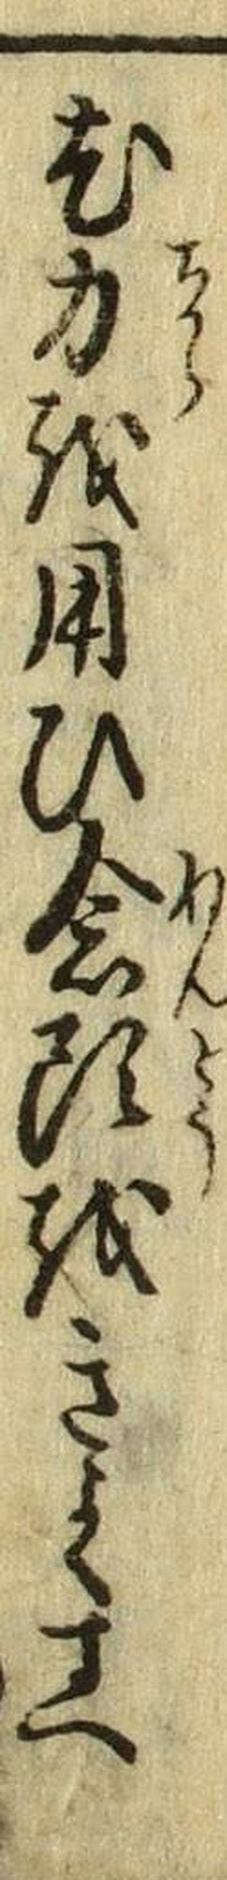尤力を用ひ念頭をきよくすへし
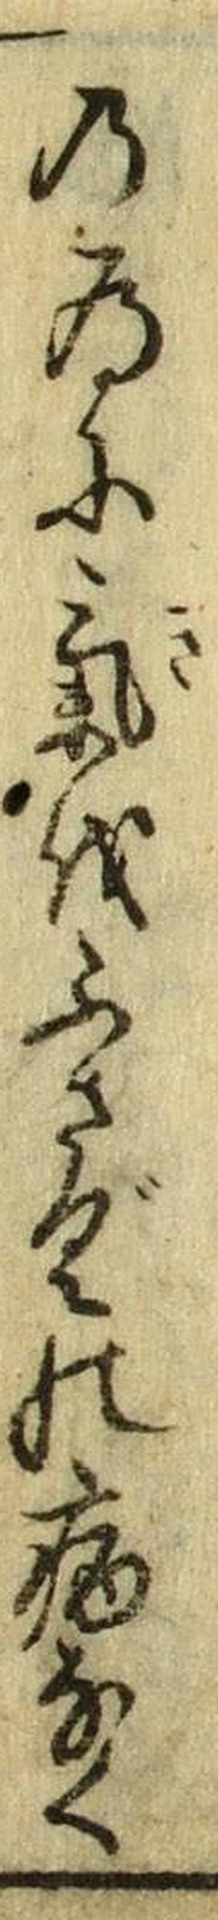の為に気をふさぐの病なく
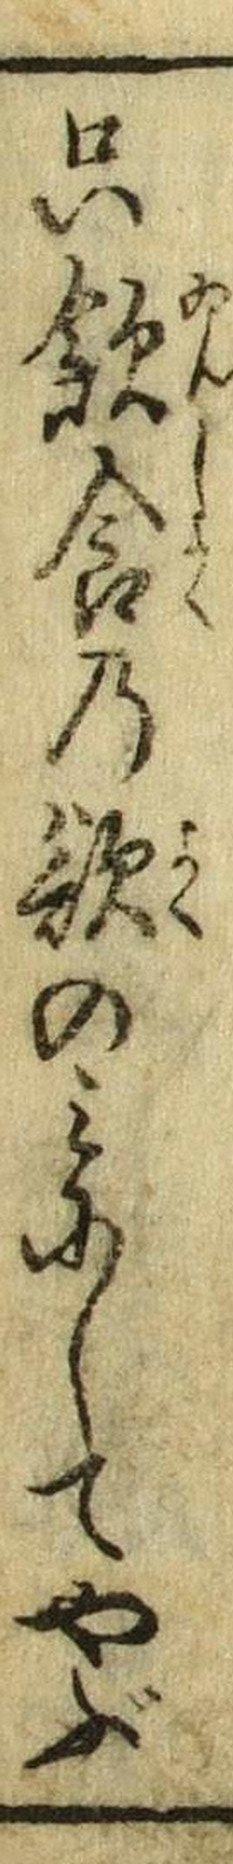只飲食の欲のみにしてやぶ

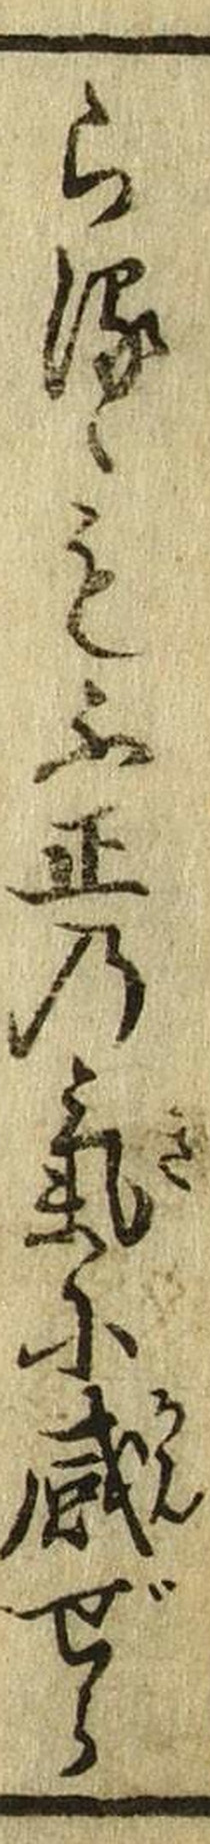らるゝも不正の気に感ぜら
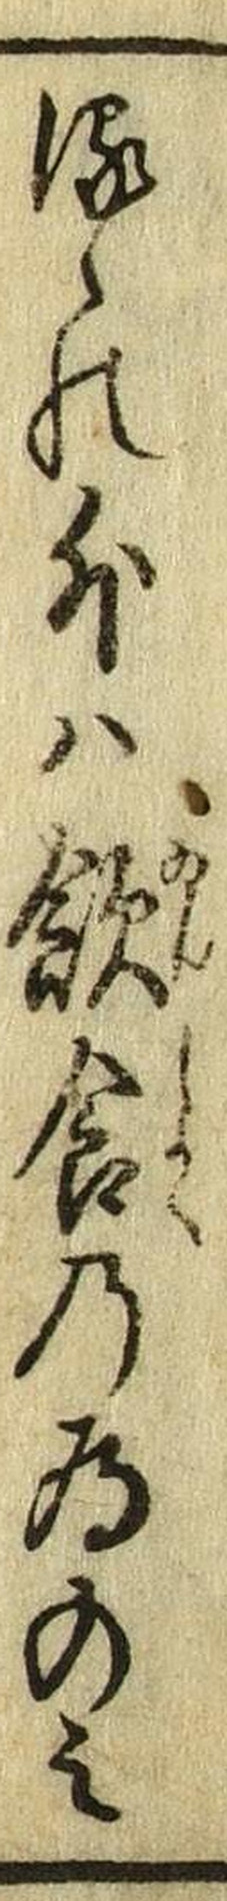るゝの外は飲食の為のみ
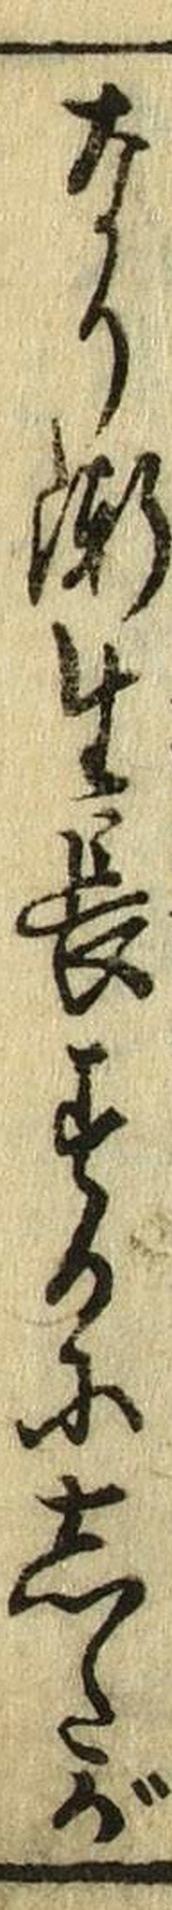なり漸生長するにしたが
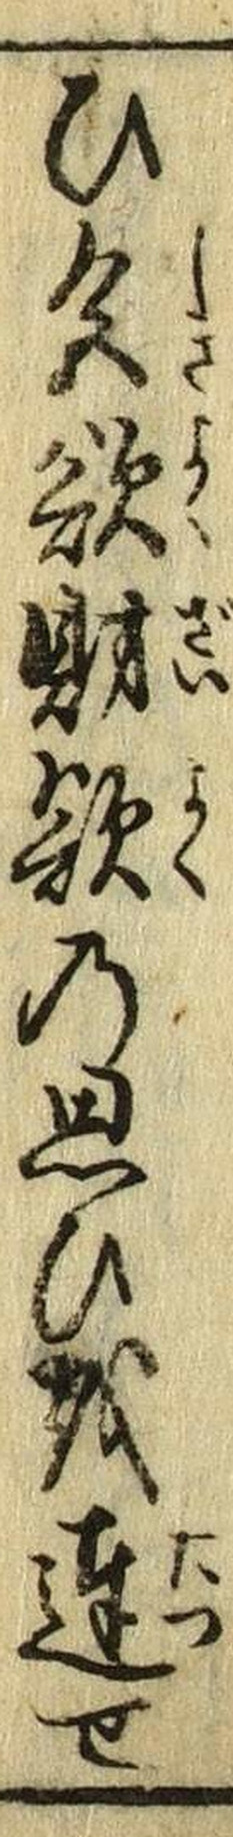ひ色欲財欲の思ひを達せ
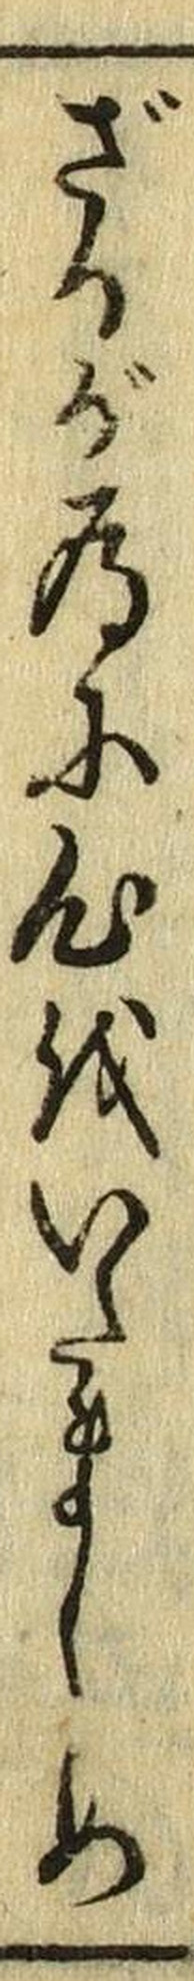ざるが為に心をいたましめ
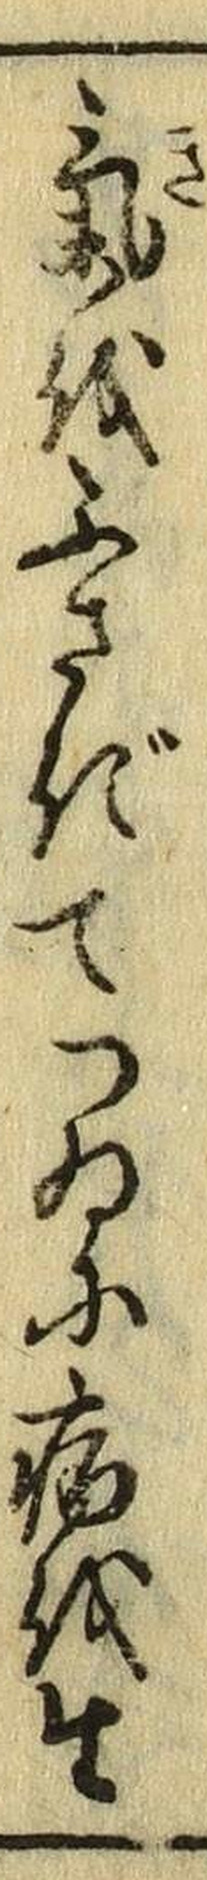気をふさぎてつゐに病を生
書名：居家養生記
